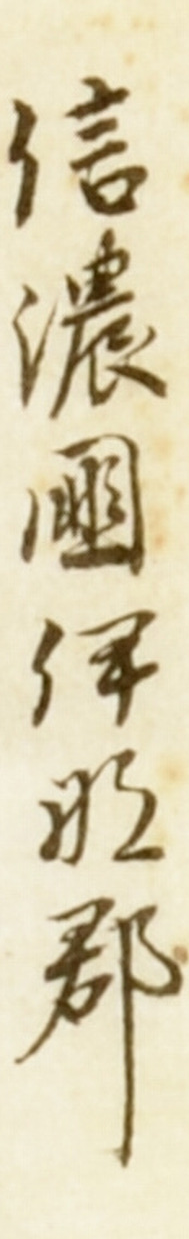信濃国伊那郡
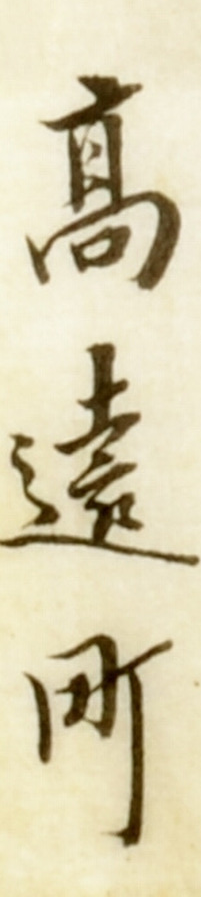高遠町

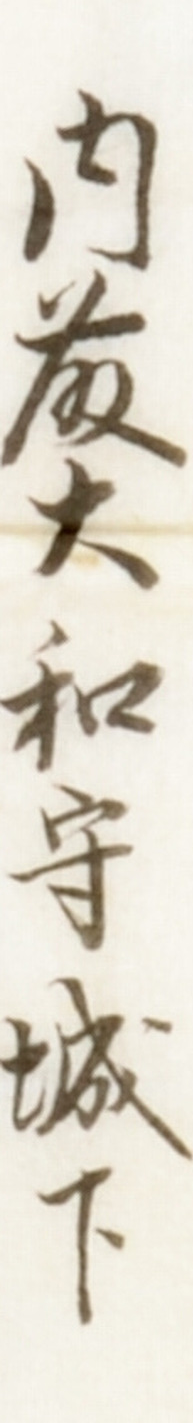内藤大和守城下
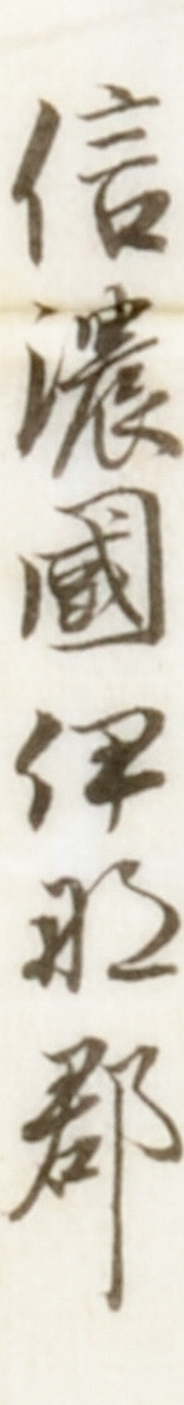信濃国伊那郡
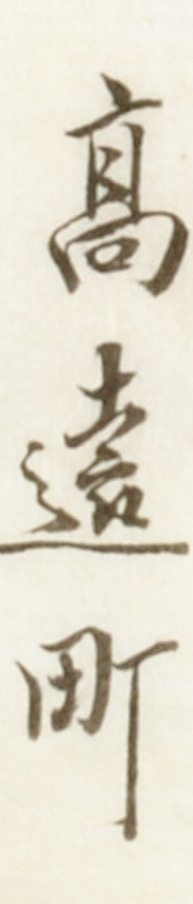高遠町
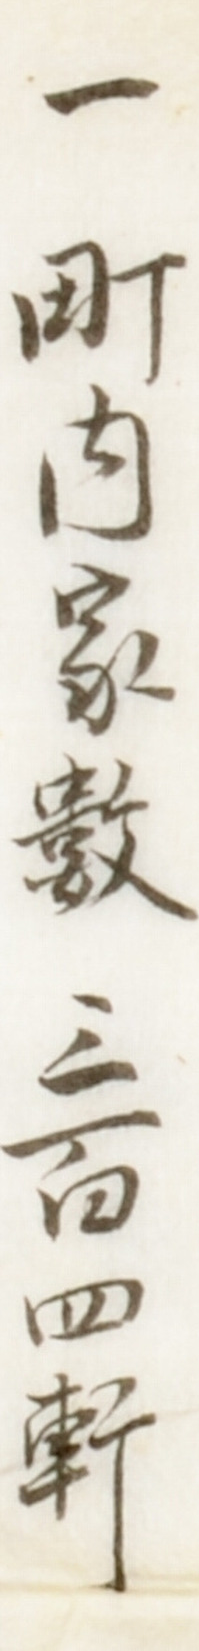一町内家数三百四軒
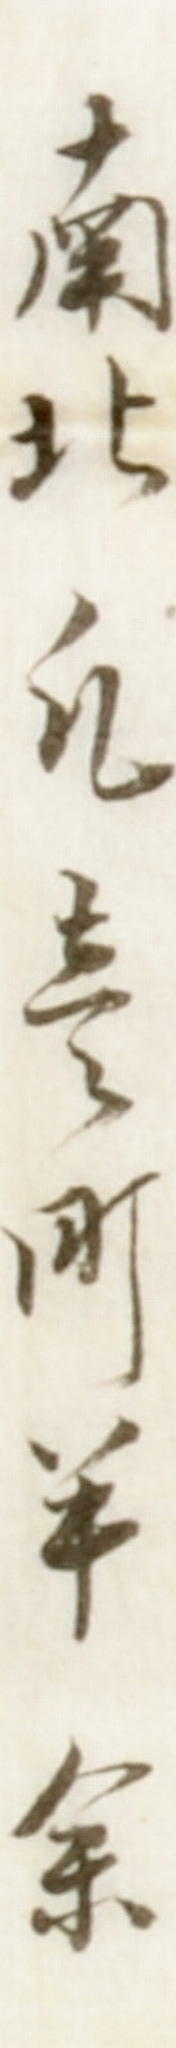南北凡壱町半余
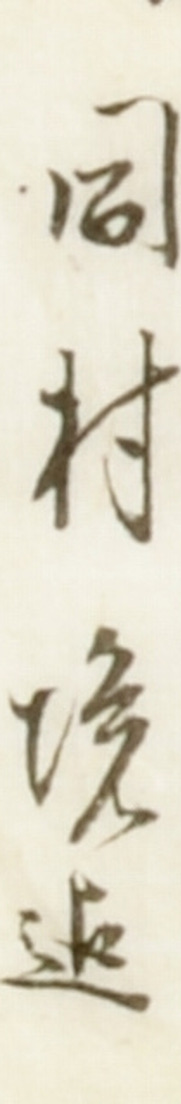同村境迄
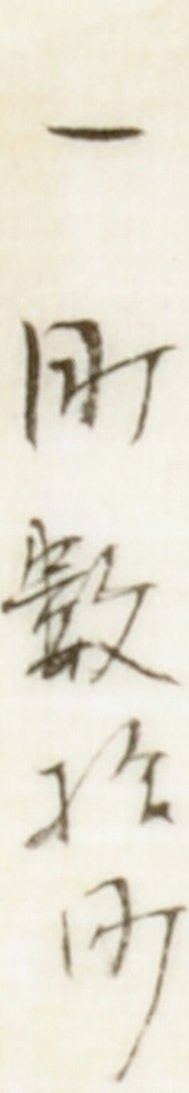一町数拾町

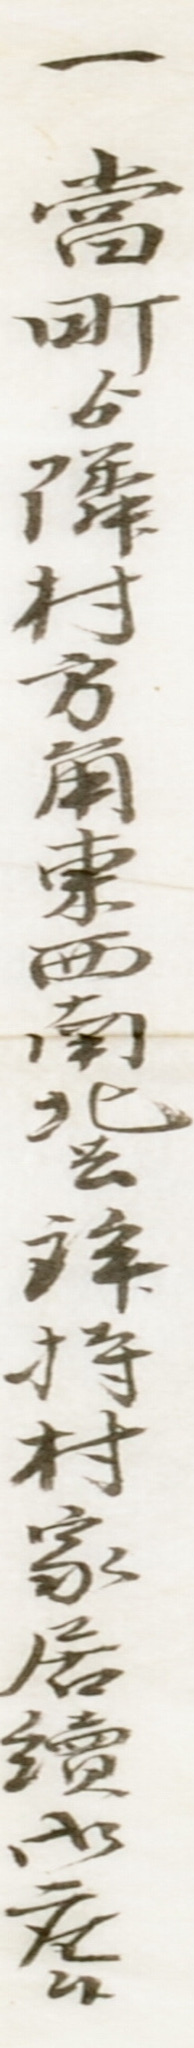一当町ゟ隣村方角東西南北共鉾持村家居続御座候
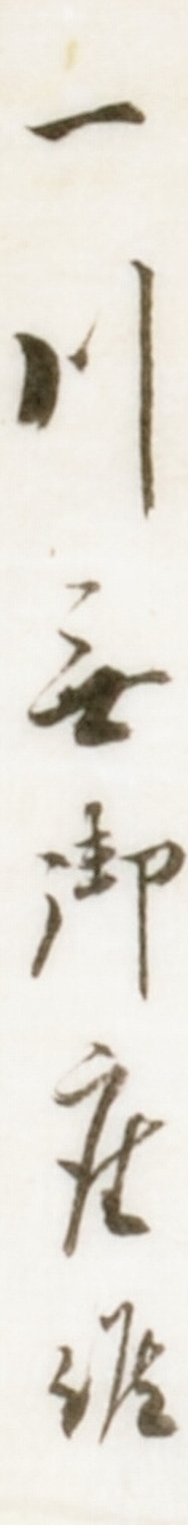一川無御座候
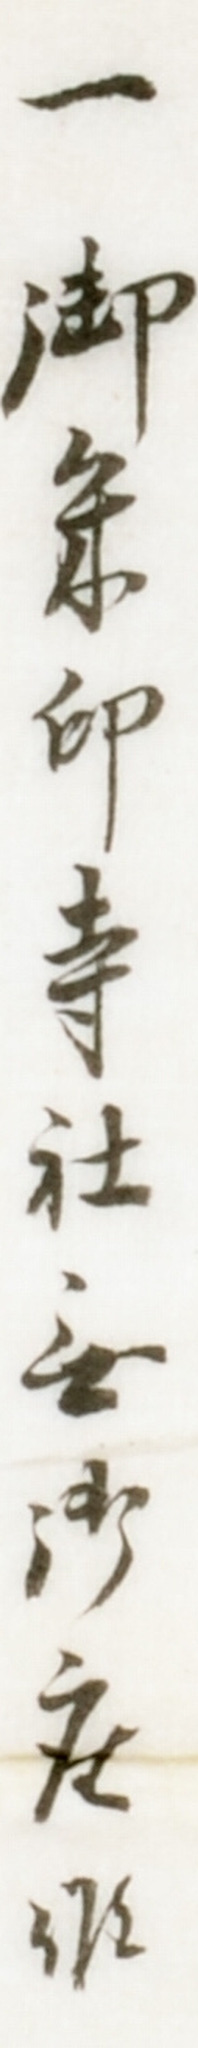一御朱印寺社無御座候
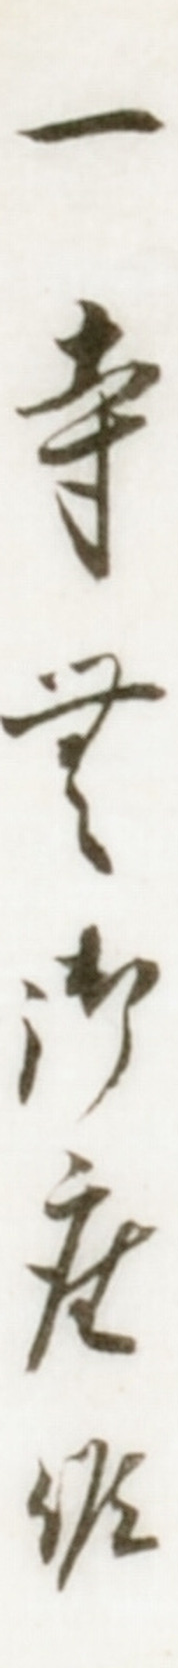一寺無御座候
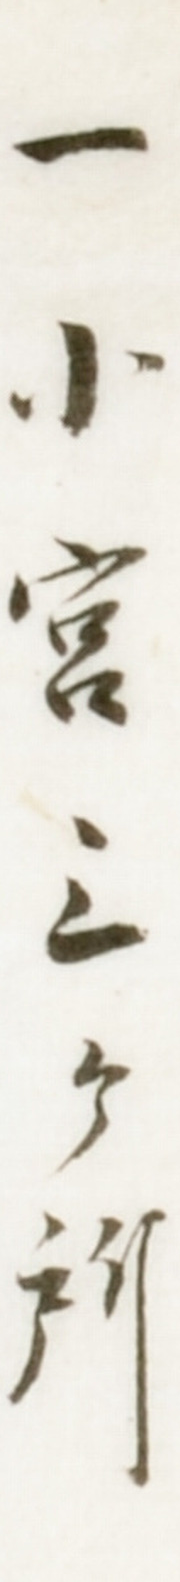一小宮三ケ所
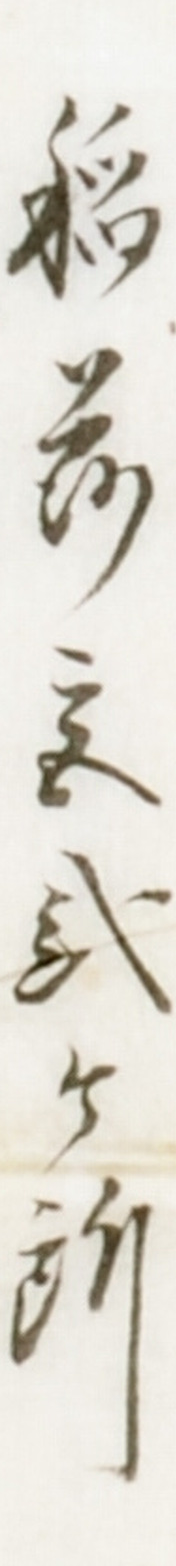内稲荷宮弐ケ所
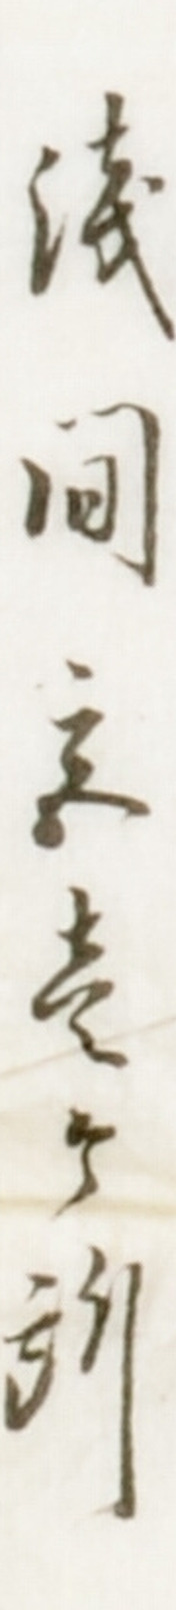浅間宮壱ケ所
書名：書上
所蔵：伊那市立高遠町図書館・合同会社AMANE
